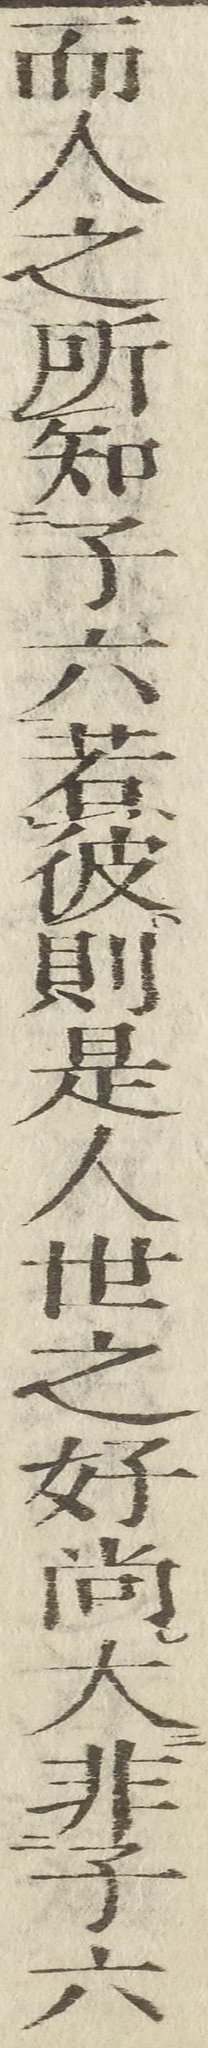而人之所知ニ子六若彼。則是人世之好尚。大非ニ子六

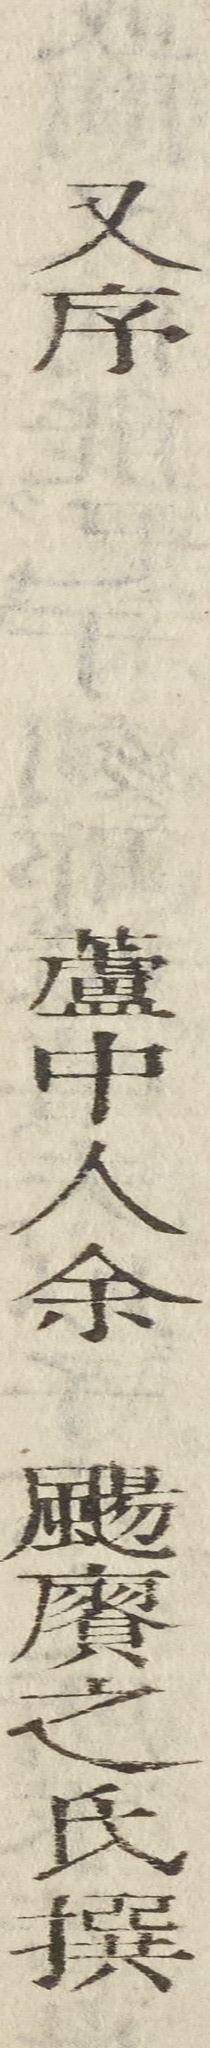又序蘆中人余𩗺𢋫之氏撰

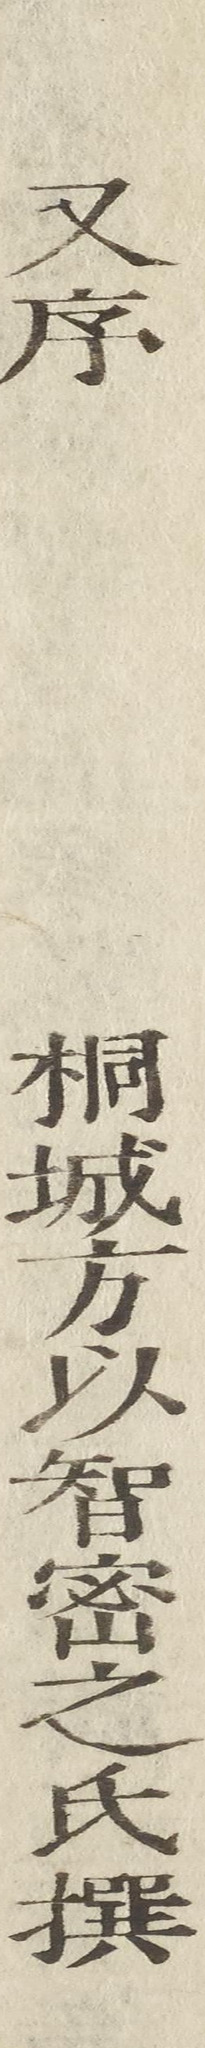又序桐城方以智密之氏撰

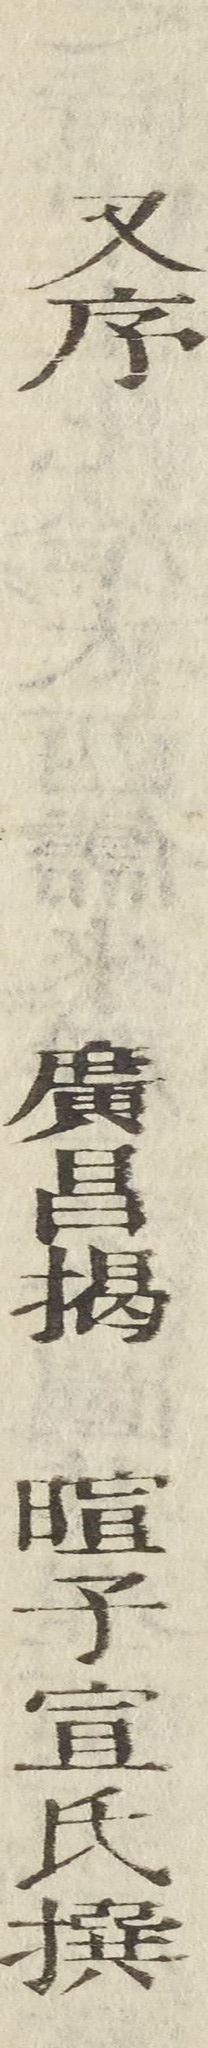又序広昌掲暄子宣氏撰

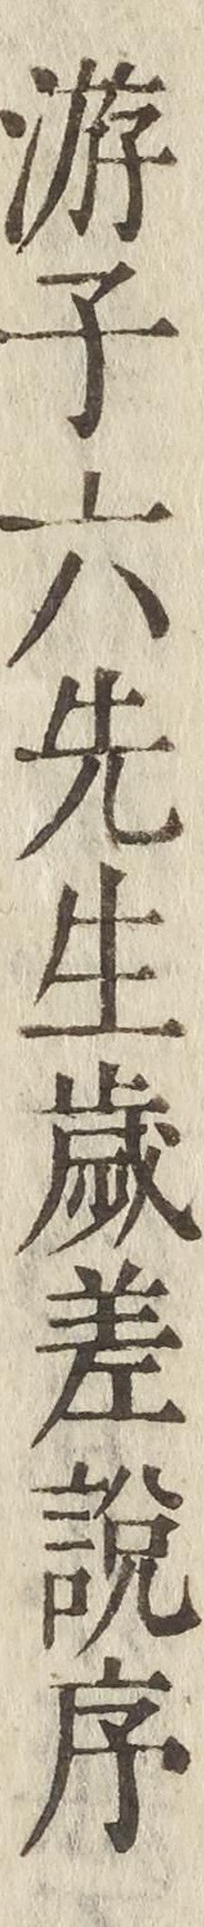游子六先生歳差説序
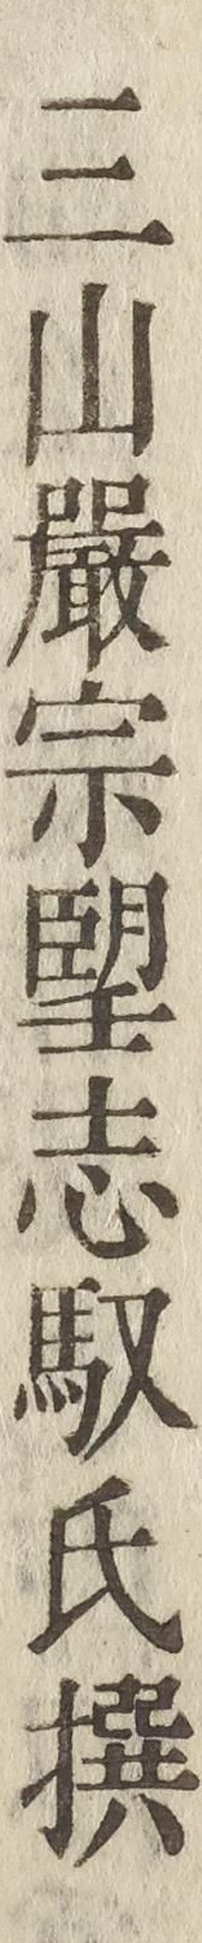三山厳宗望志馭氏撰

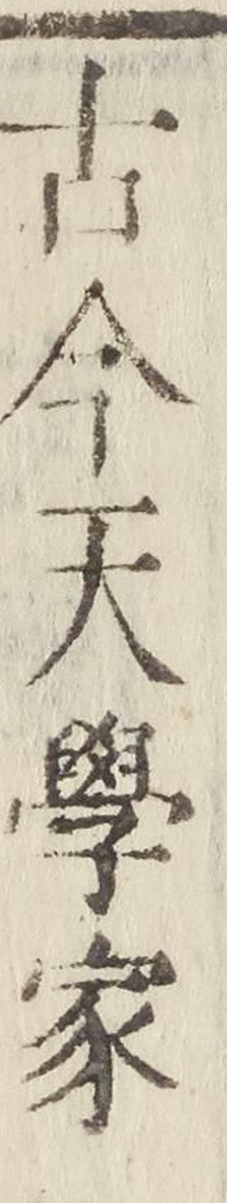古今天学家
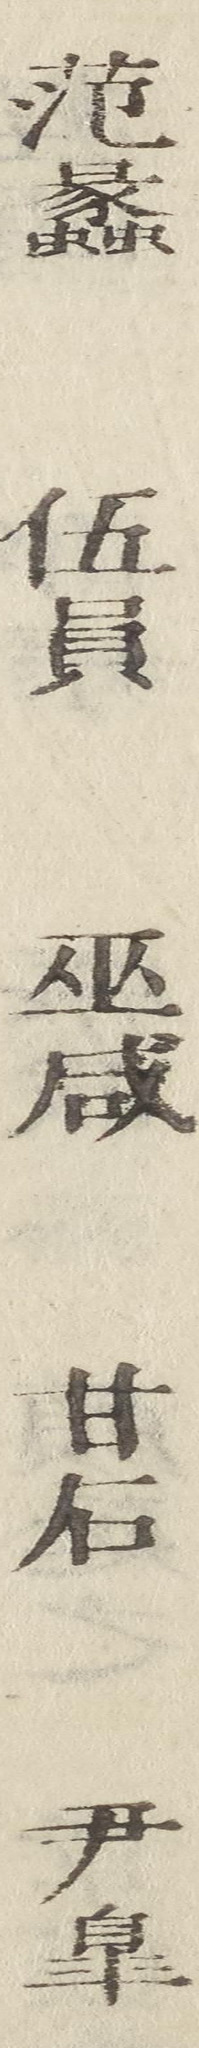范蠡伍員坐咸甘石尹皐
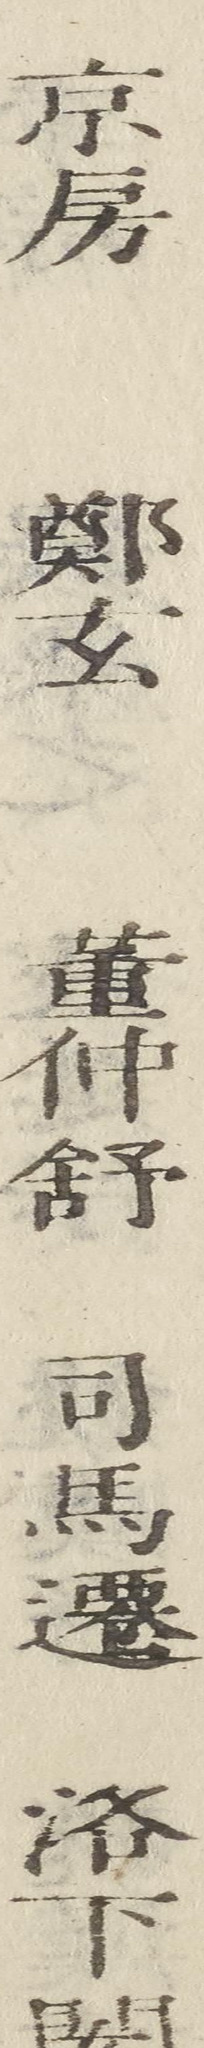京房鄭玄菫仲舒司馬遷洛下閎
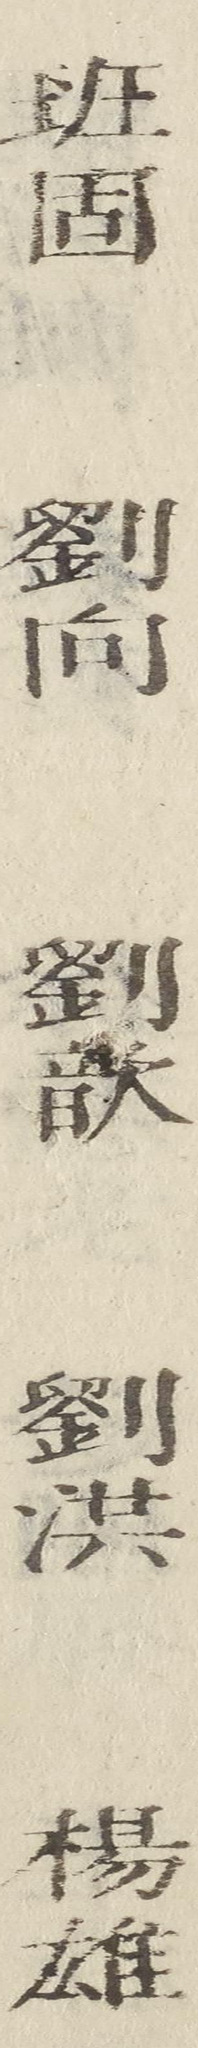班固劉向劉歆劉洪楊雄
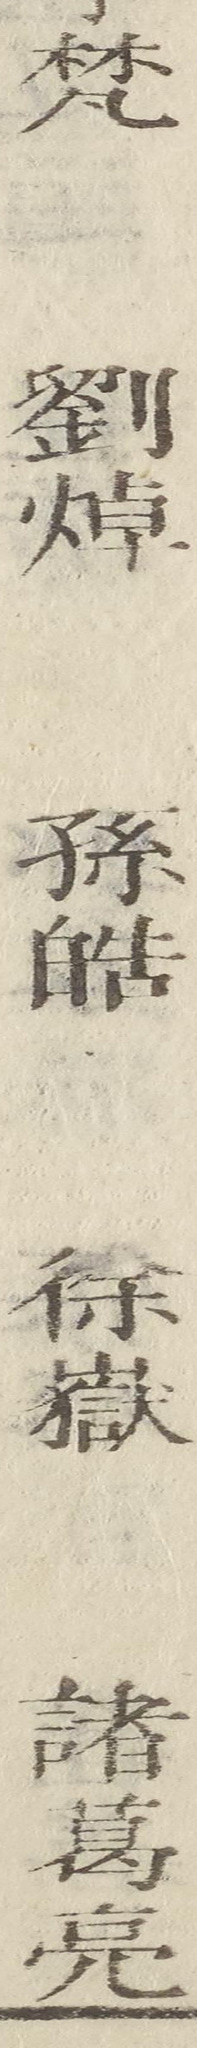李梵劉焯孫晧徐嶽諸葛亮
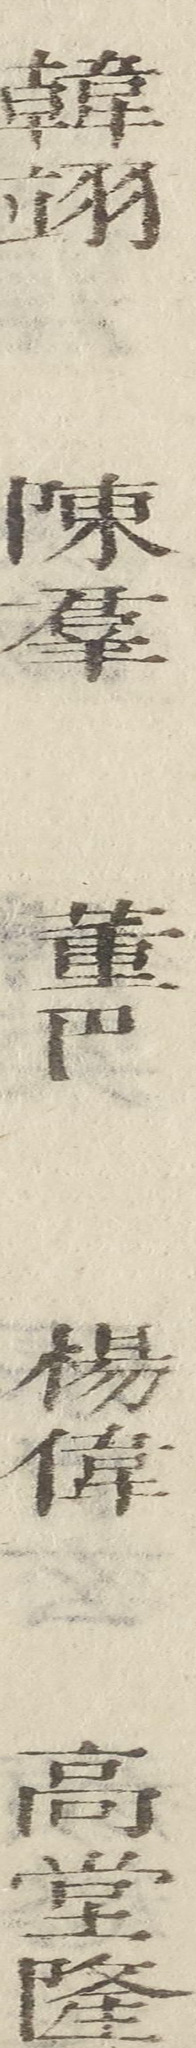韓翊陳羣菫巴楊偉高堂隆

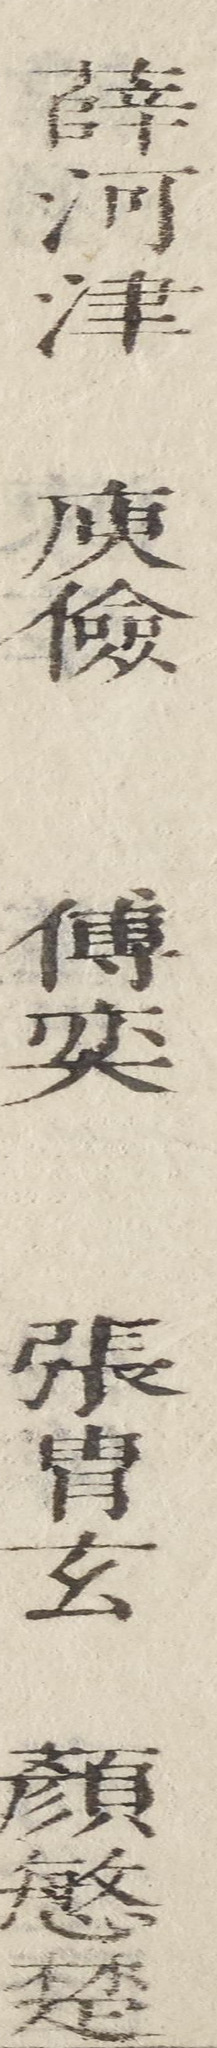薛河津庚儉傳奕張冑玄顔慜楚
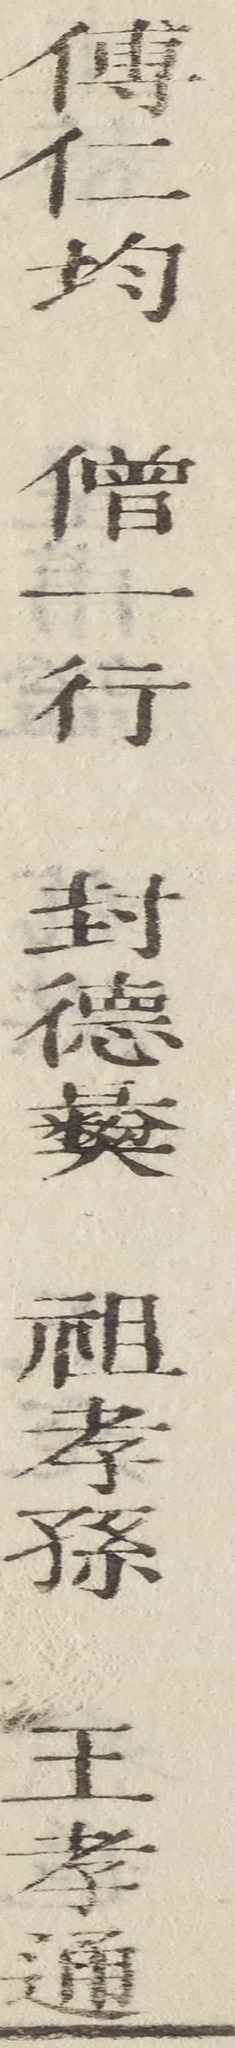傳仁均僧一行封徳彜祖孝孫王孝通
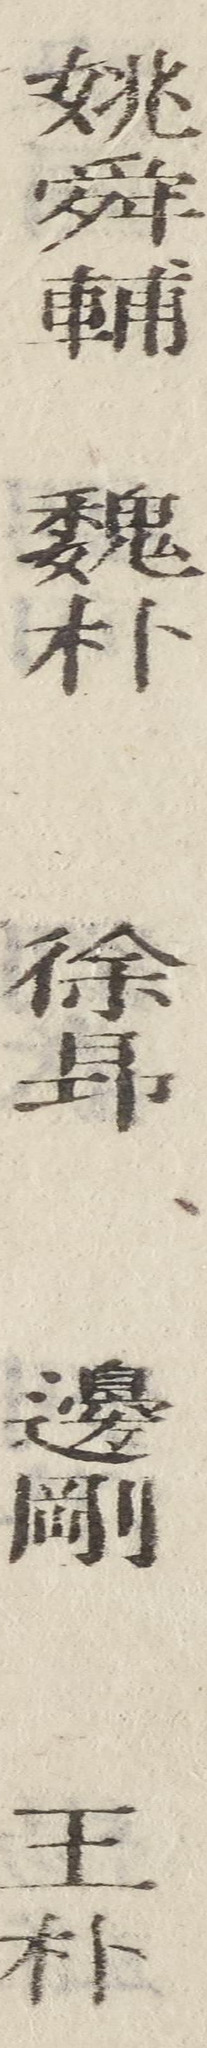姚瞬輔魏朴徐昴邊剛王朴
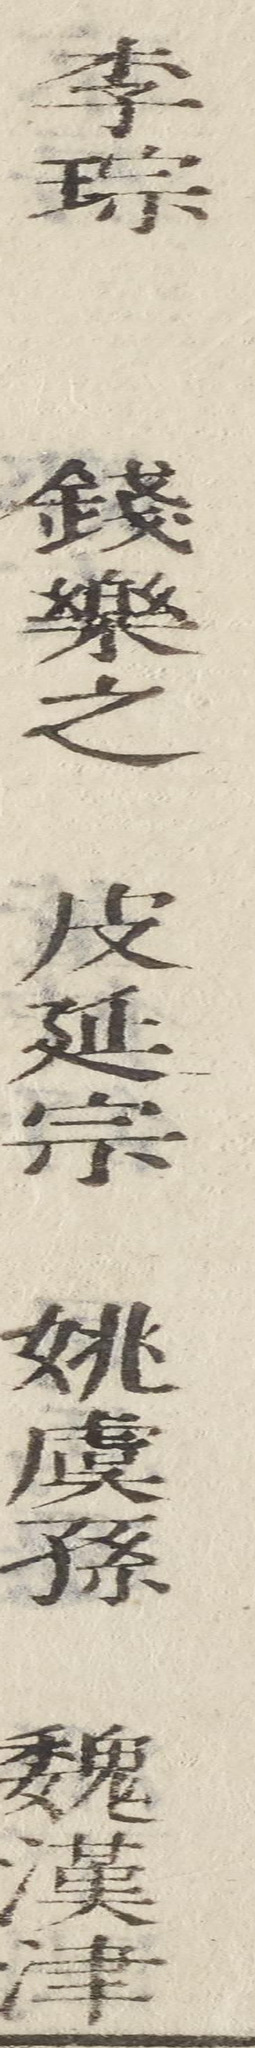李琮銭楽之皮延宗姚虞孫魏漢津
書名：天經或問　序圖
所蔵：東京大学地震研究所図書室 Earthquake Research Institute Library, The University of Tokyo, JAPAN
